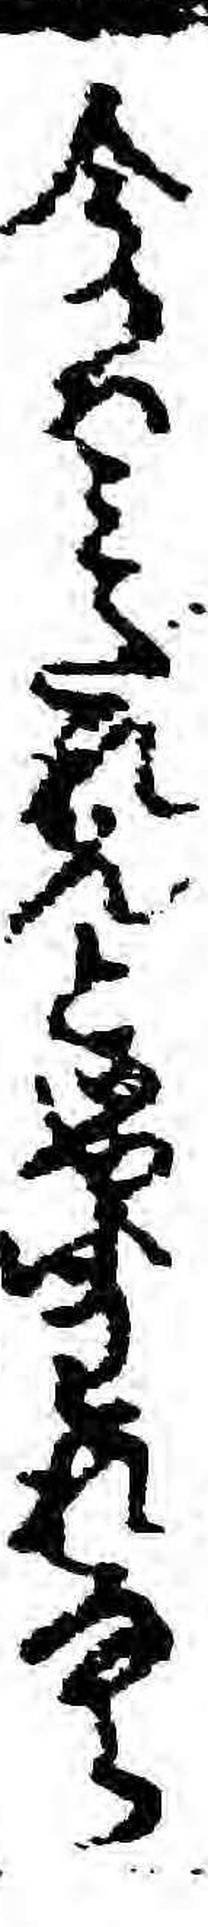今にはみだれんと思ふわれなら
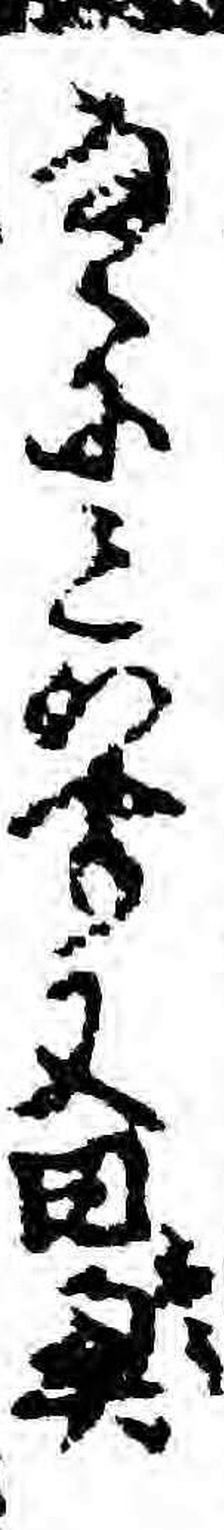なくにといへり又曰奥
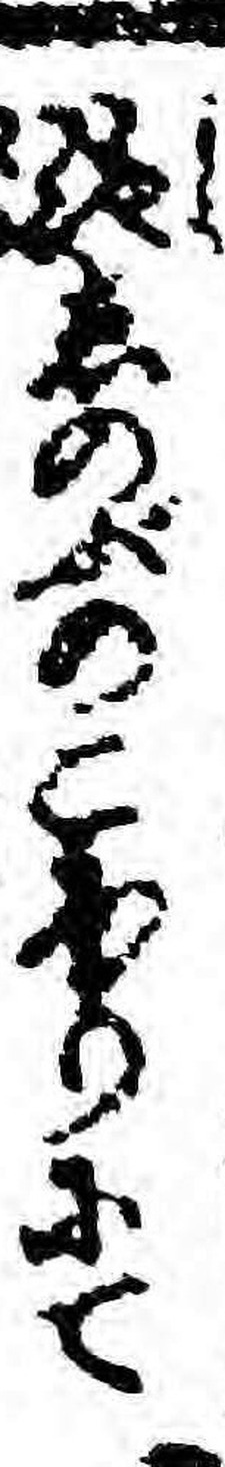州しのぶのこほりにて
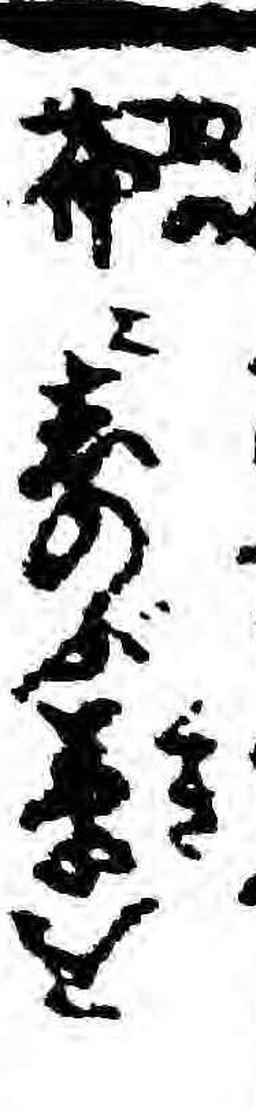布にしのぶ草を
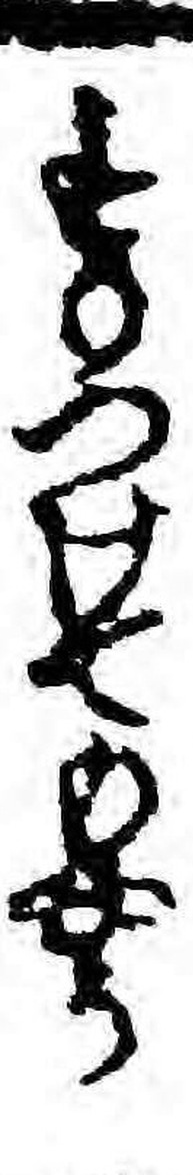すりつけてもやう
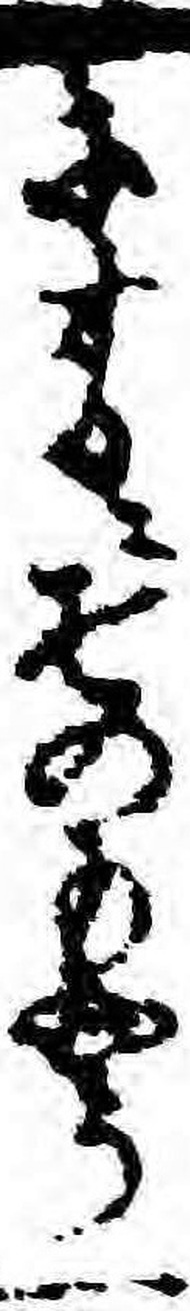にするにそのもやう
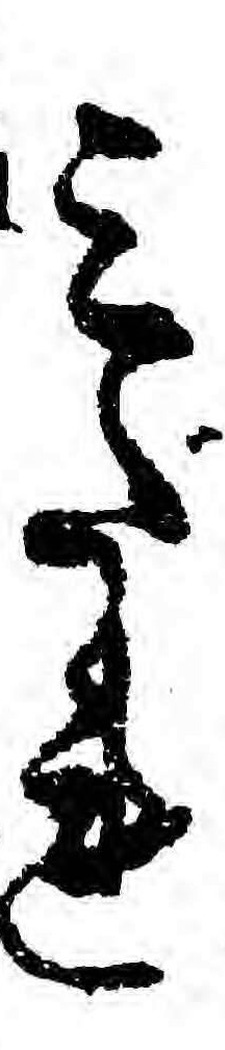みだれ
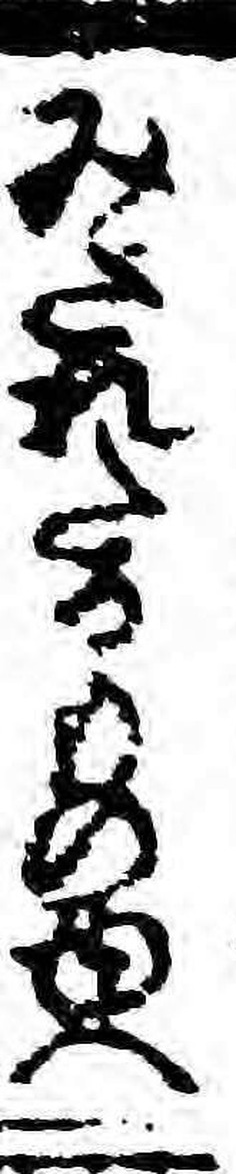みだれたるものゆへ
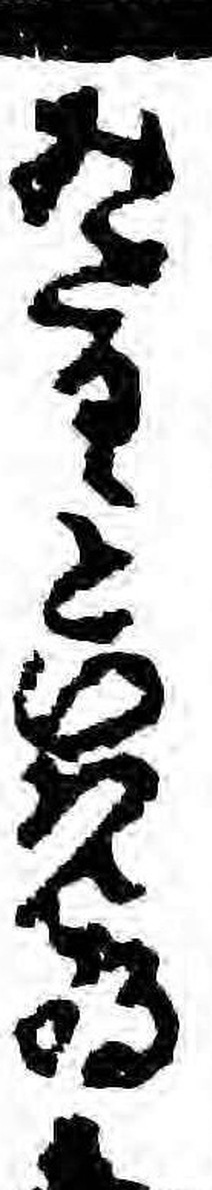みたるゝといはん為
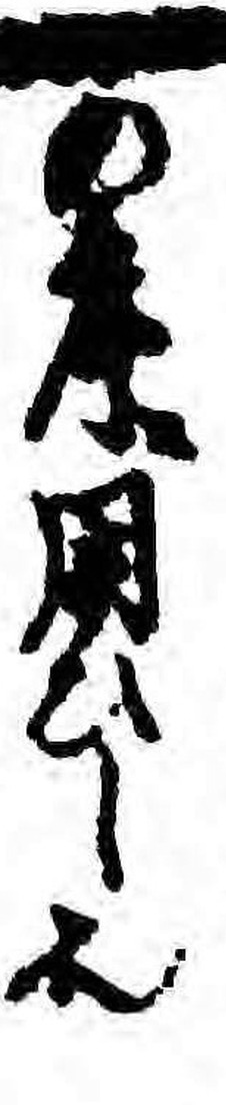の序に用ひし也
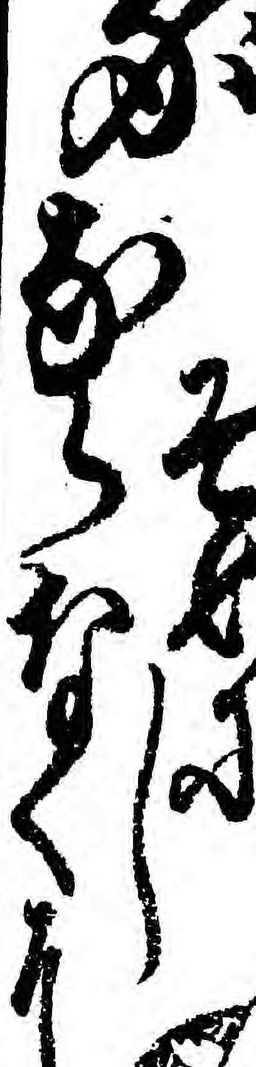我ならなくに
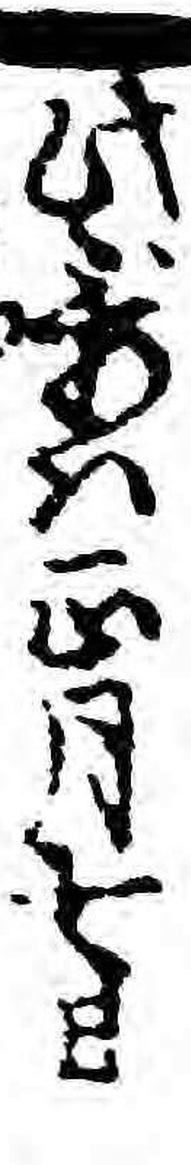此哥は正月七日
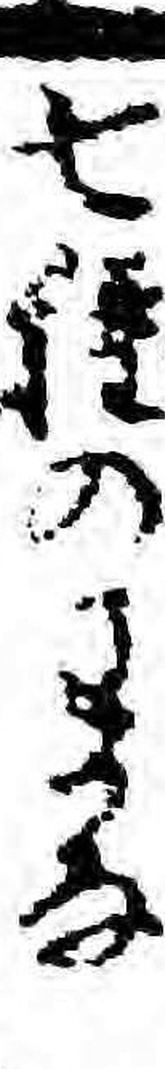七種のわかな
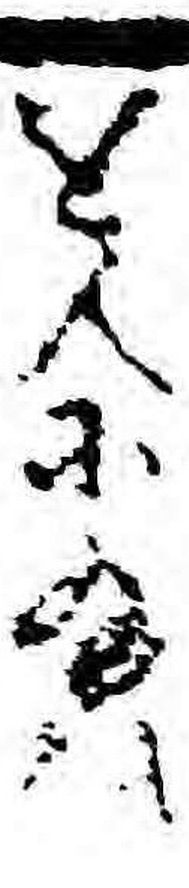を人に給ひ
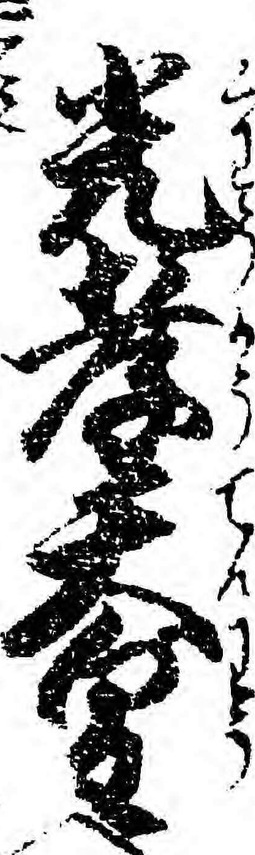光孝天皇
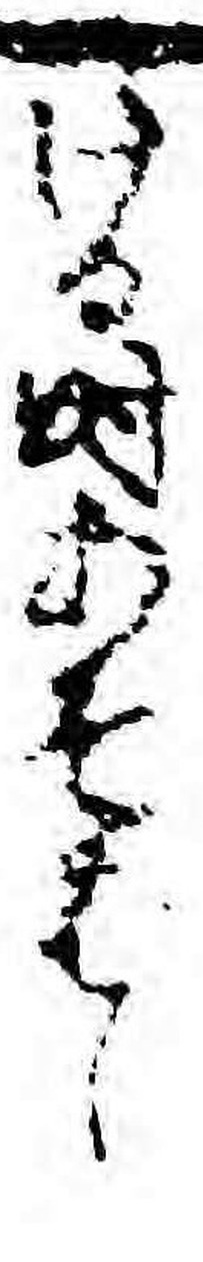ける時あそばし
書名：頭書和歌注譯／壽賀多百人一首小倉錦
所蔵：国文学研究資料館
